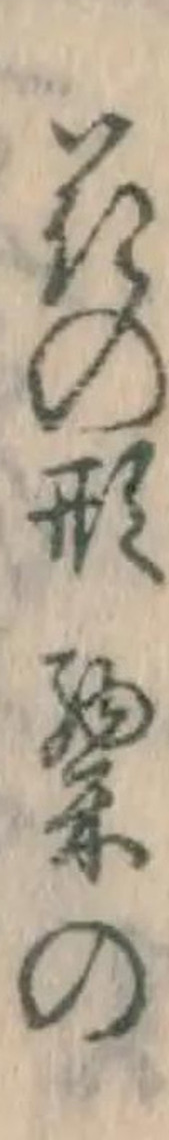花の形粟の
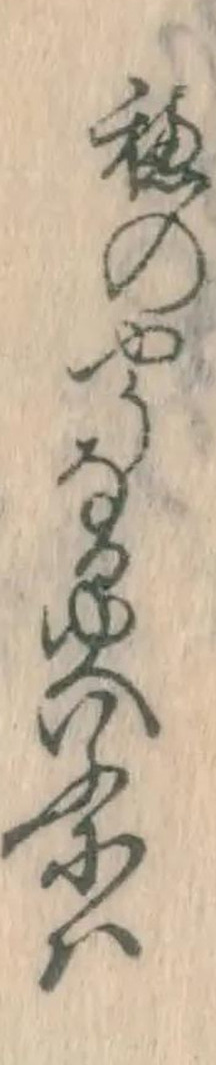穂のやうなるゆへいふには
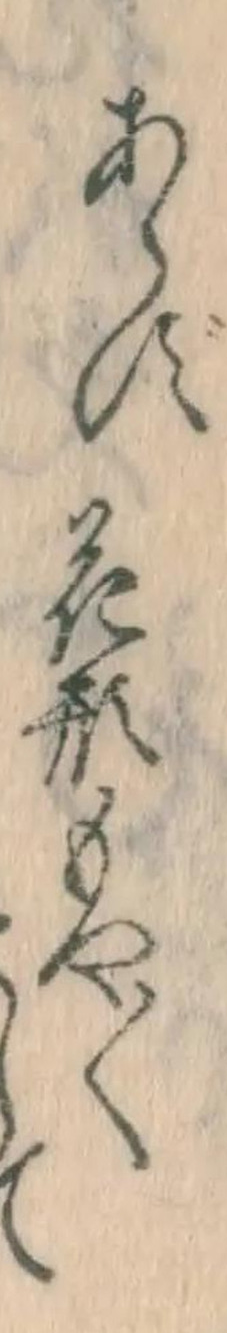あらずは花形もや〳〵
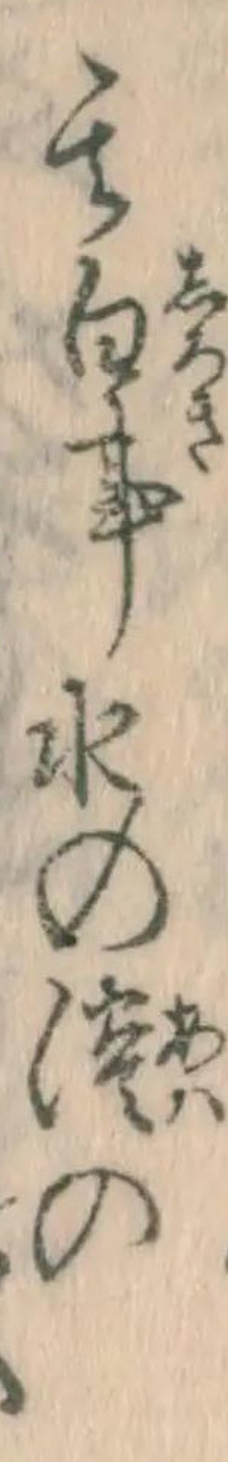其白事水の淡の
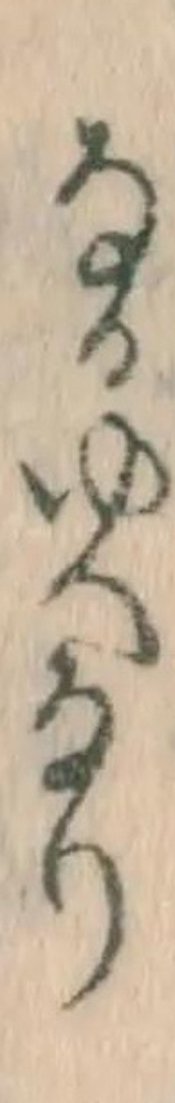なるゆへなり
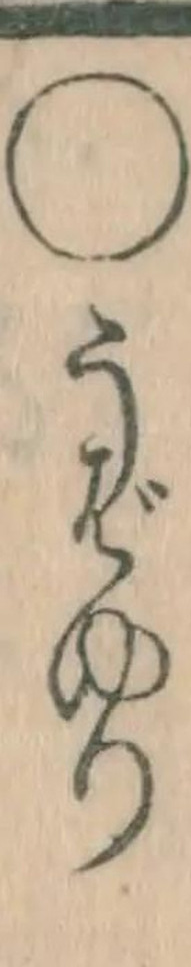〇うばゆり
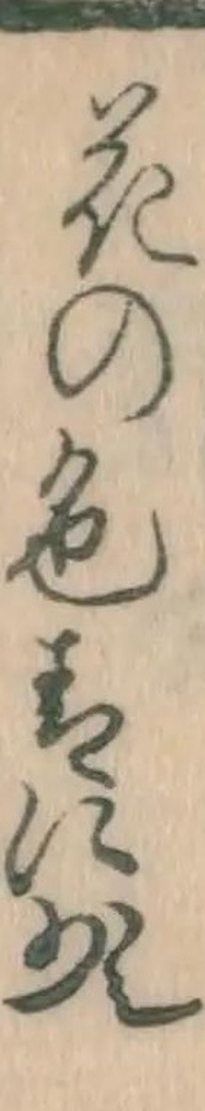花の色青に少し
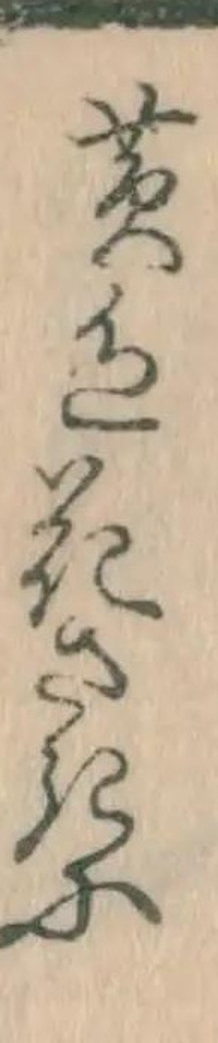黄色花さきに
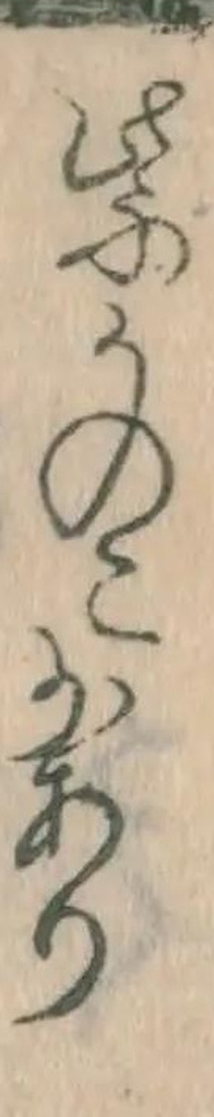紫かのこ少あり
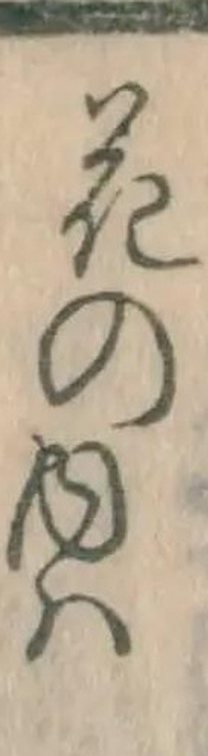花の内は
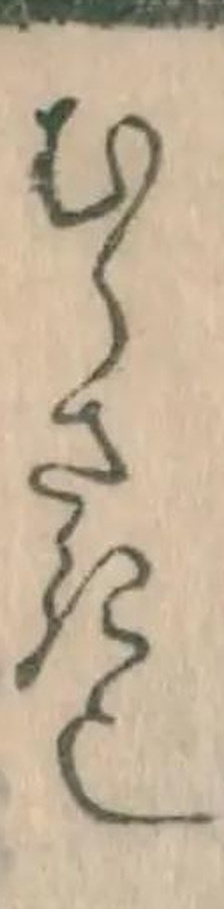むらさき也
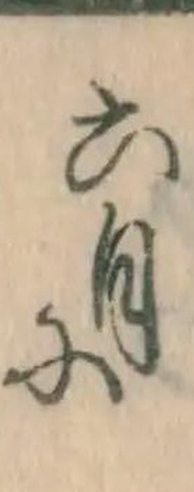六月に

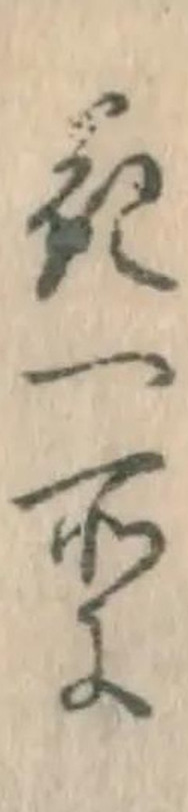花一所に
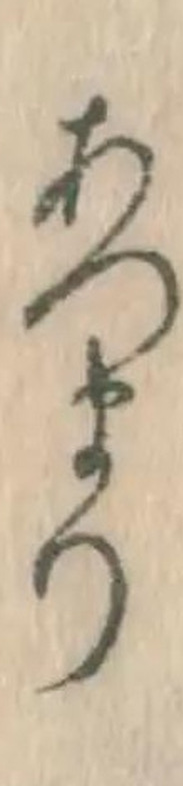あつまり
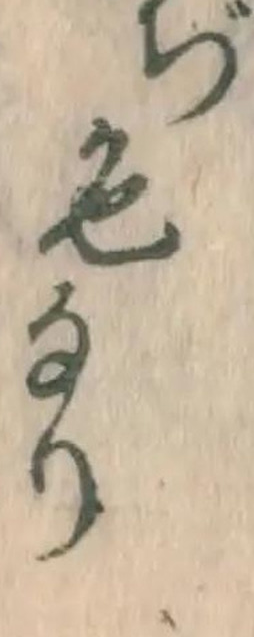色なり
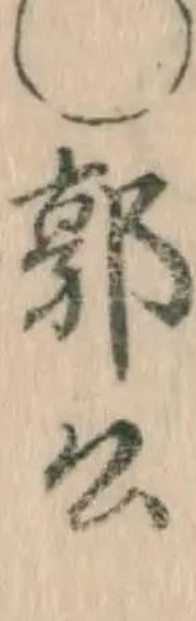〇郭公
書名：艸花繪前集. [3]
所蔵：国立国会図書館 National Diet Library, JAPAN
